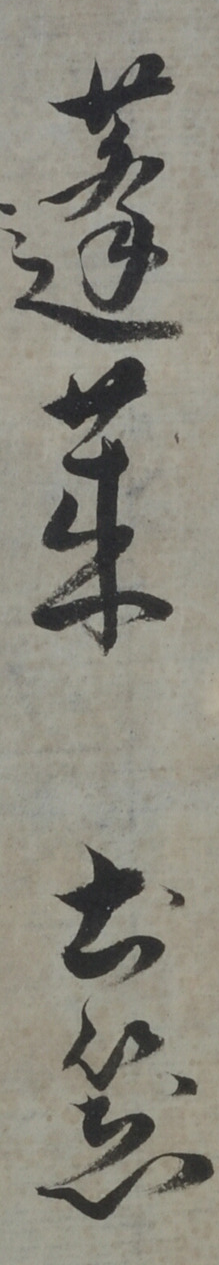蓬莱土器
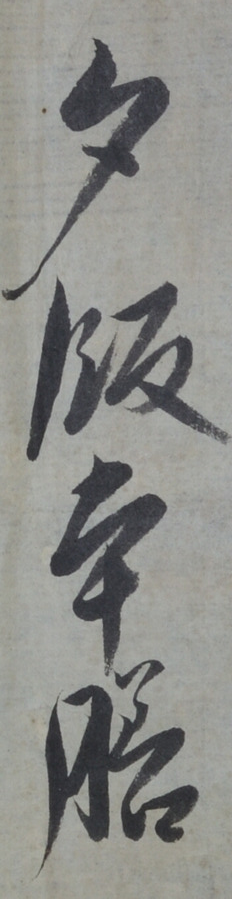夕飯本膳

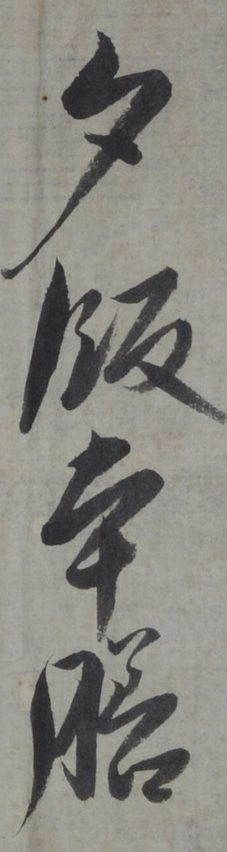夕飯本膳
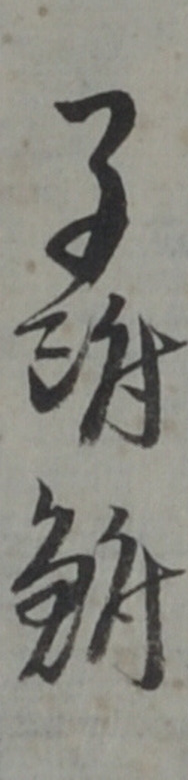子附鮒
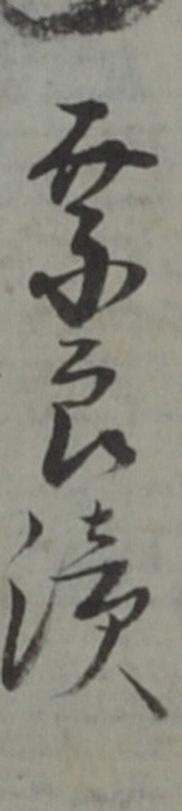奈良漬
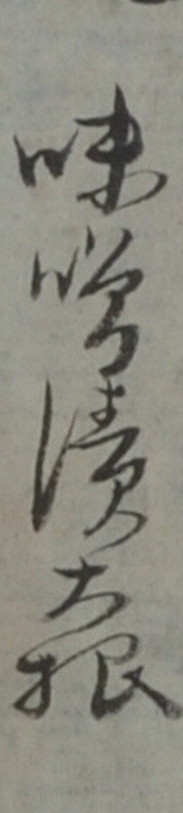味噌漬大根
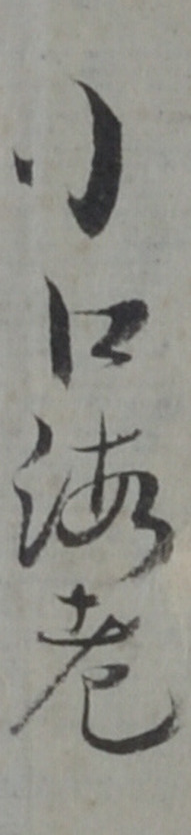小口海老
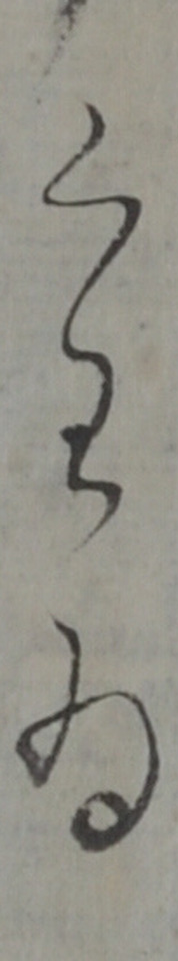くわゐ
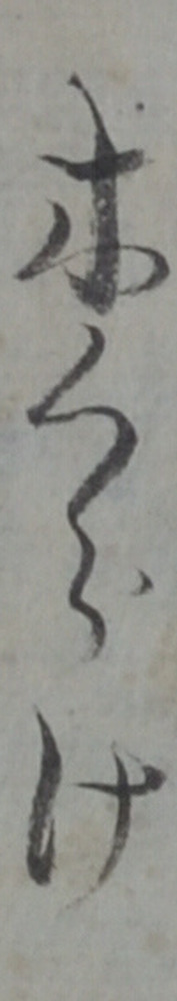木くらけ
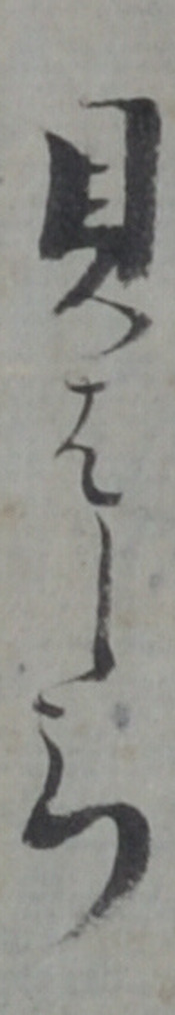貝はしら
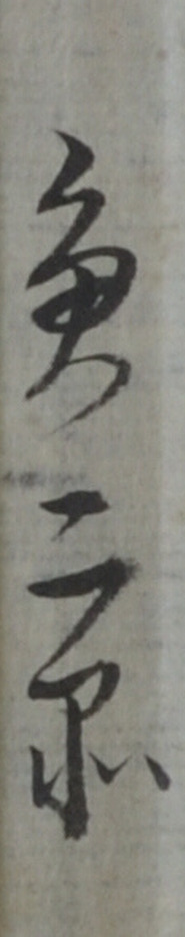平魚二品

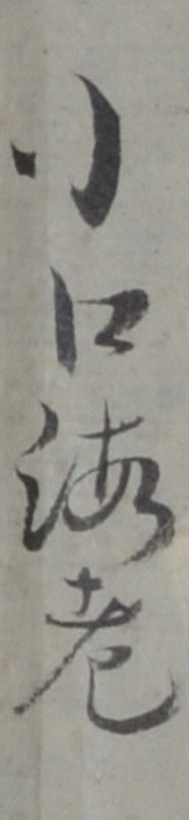小口海老
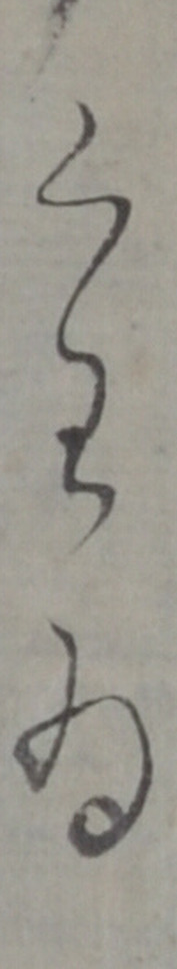くわゐ
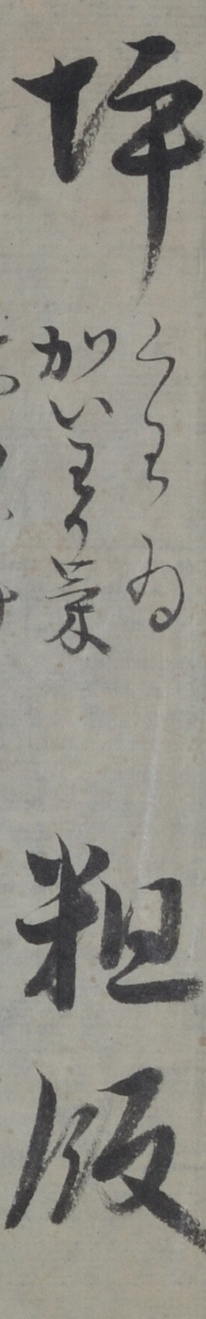坪かいわり菜粗飯
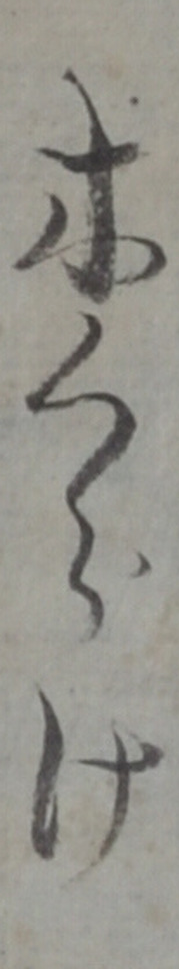木くらけ
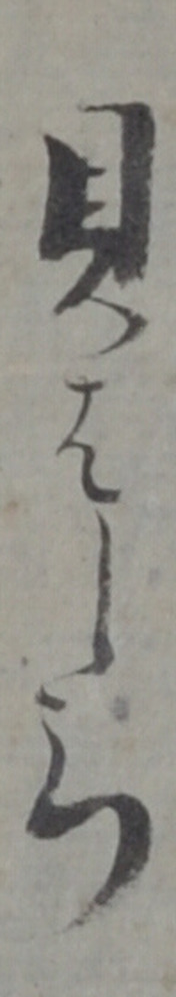貝はしら
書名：献立書上
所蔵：伊那市立高遠町図書館・合同会社AMANE
